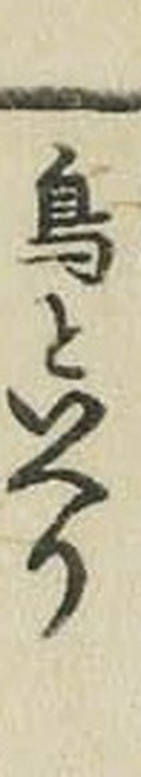鳥といへり
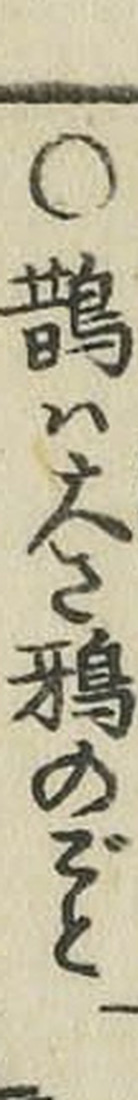○鵲は大さ鴉のごと
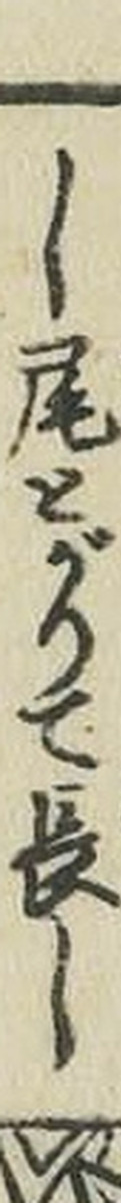し尾とがりて長し
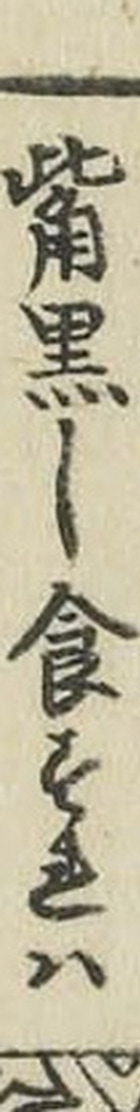觜黒し食すれは
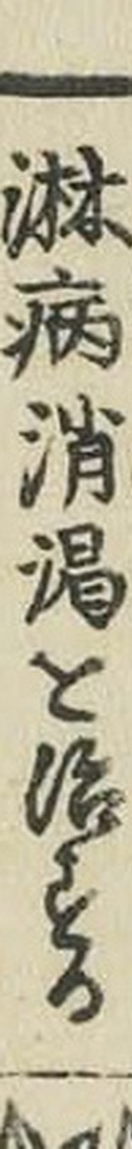痳病消渇を治する
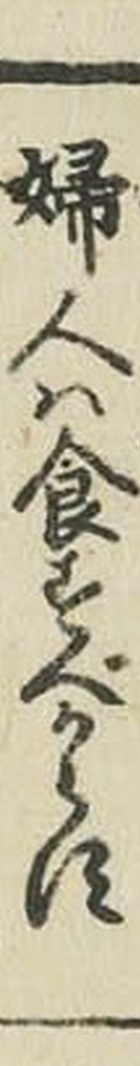婦人は食すべからす
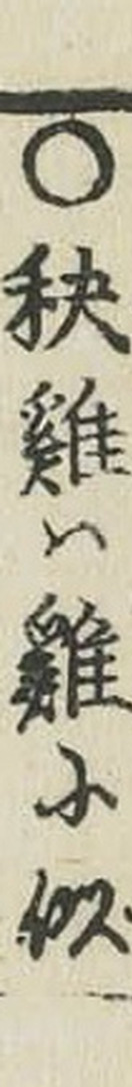○秧鶏は鶏に似
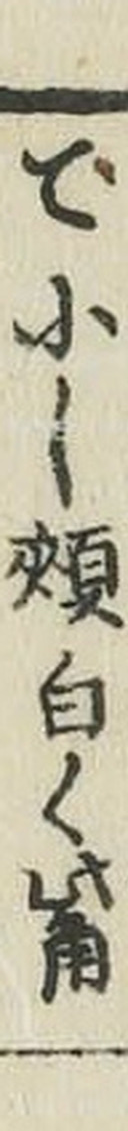て小し頬白く觜
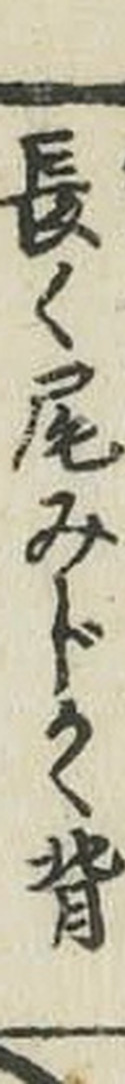長く尾みじかく背
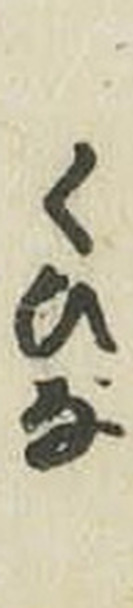くひな
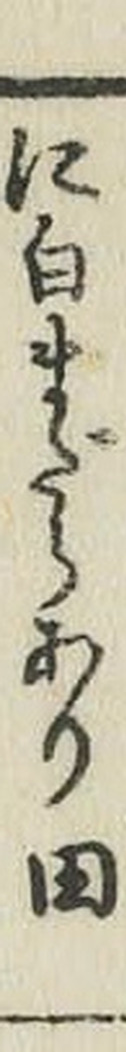に白まだらあり田
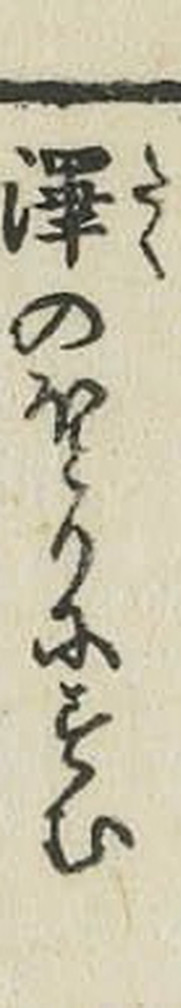沢のほとりにすむ
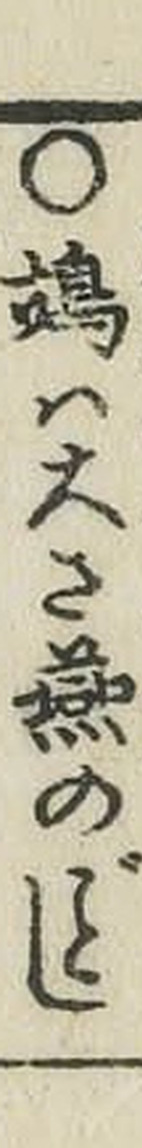○鴗は大さ燕のごとし
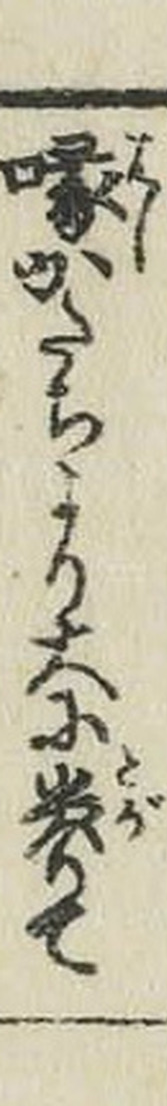喙かたちより大に尖りて
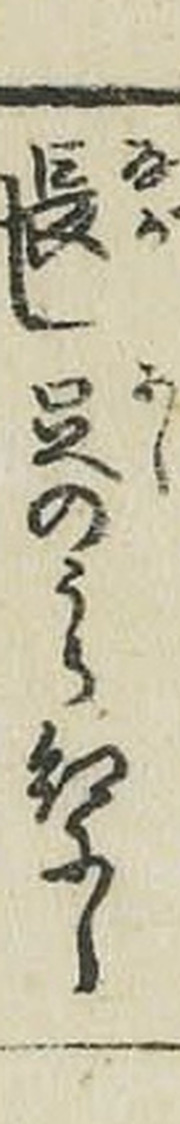長し足のうら紅にし
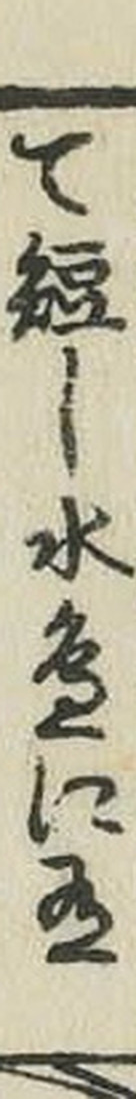て短し水辺に有
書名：増補頭書訓蒙図彙大成 10巻 6:巻之12-13
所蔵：東京学芸大学教育コンテンツアーカイブ
